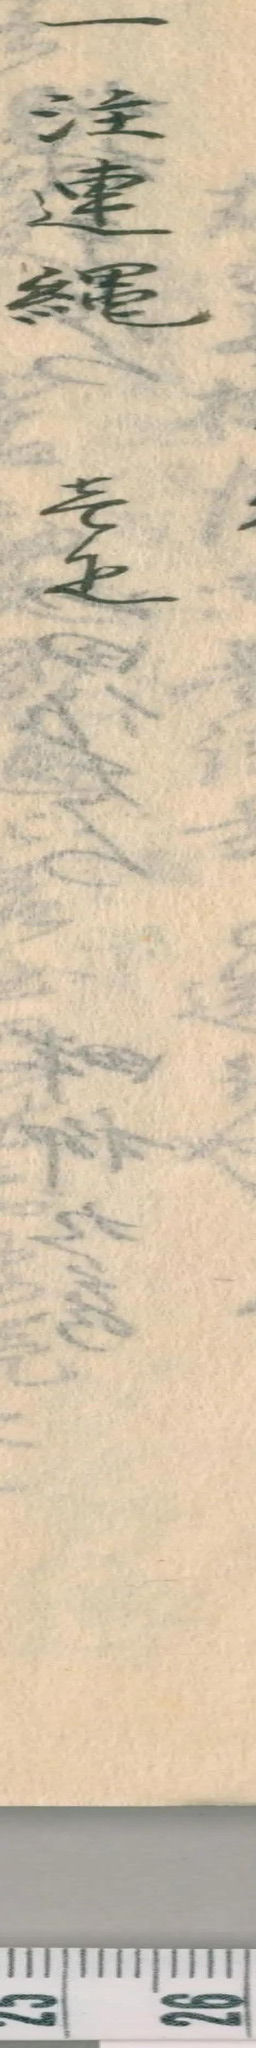一注連縄壱疋
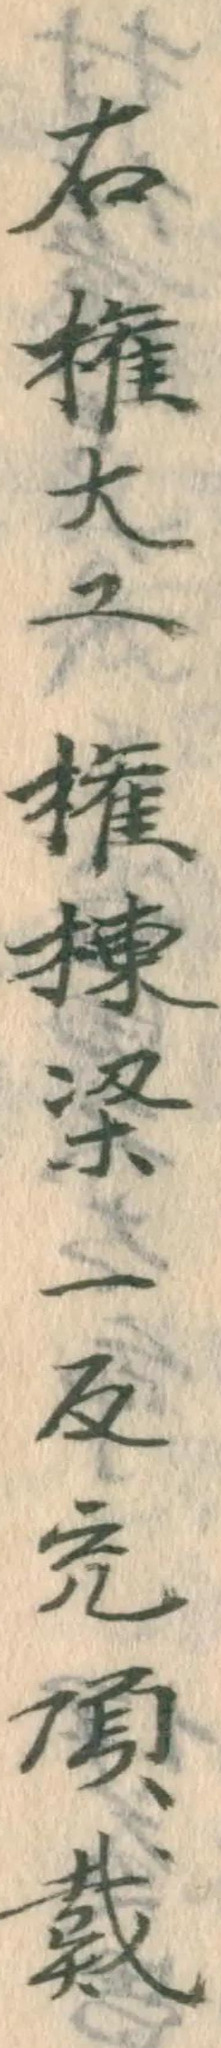右権大工権棟梁一反充頂戴
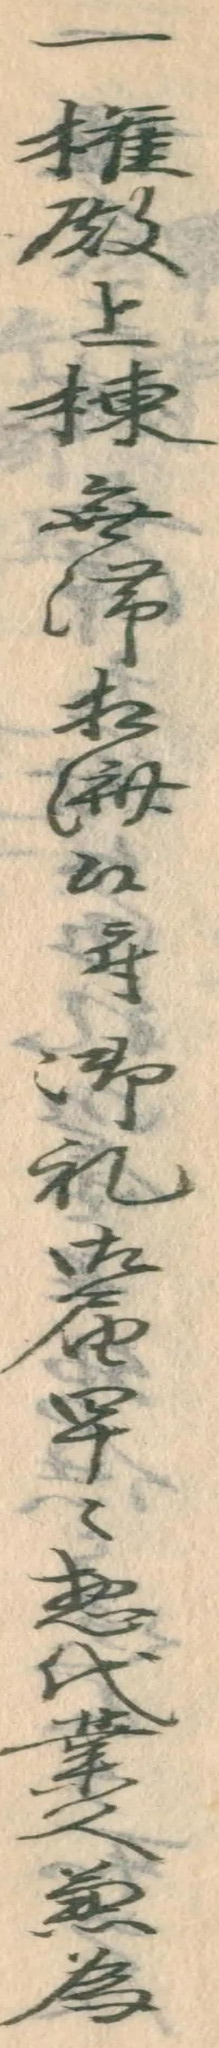一権殿上棟無滞相済候ニ付御礼御届早々惣代業久兼為
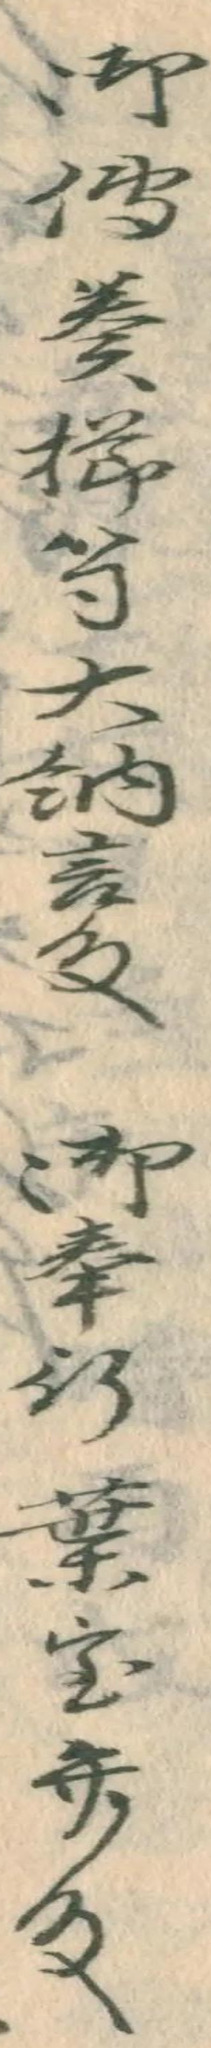御伝奏櫛笥大納言殿御奉行葉室弁殿
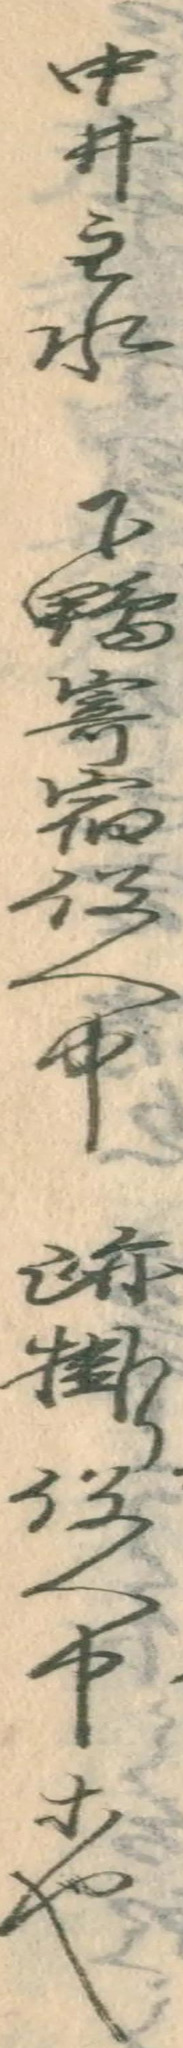中井主水下鴨寄宿役人中跡掛り役人中等也

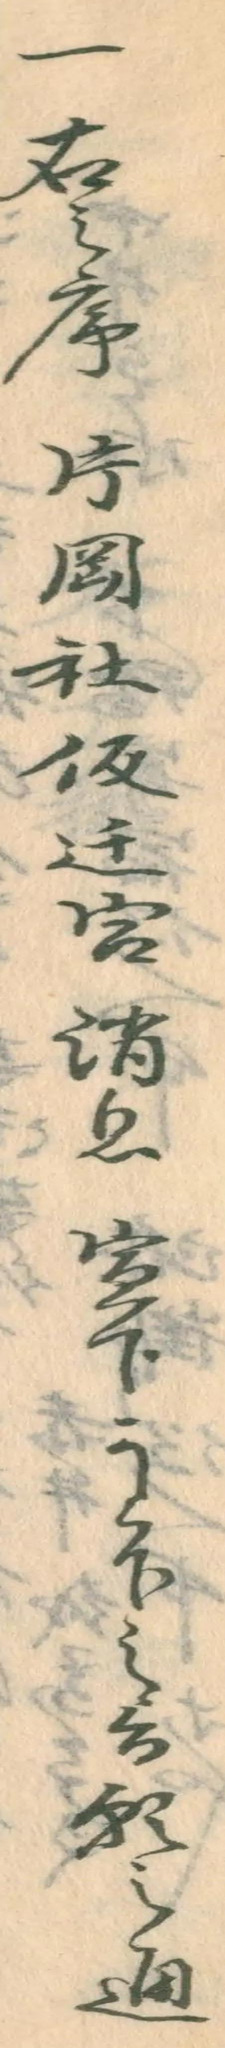一右之序片岡社仮迁宮消息宣下可被下之旨願之通
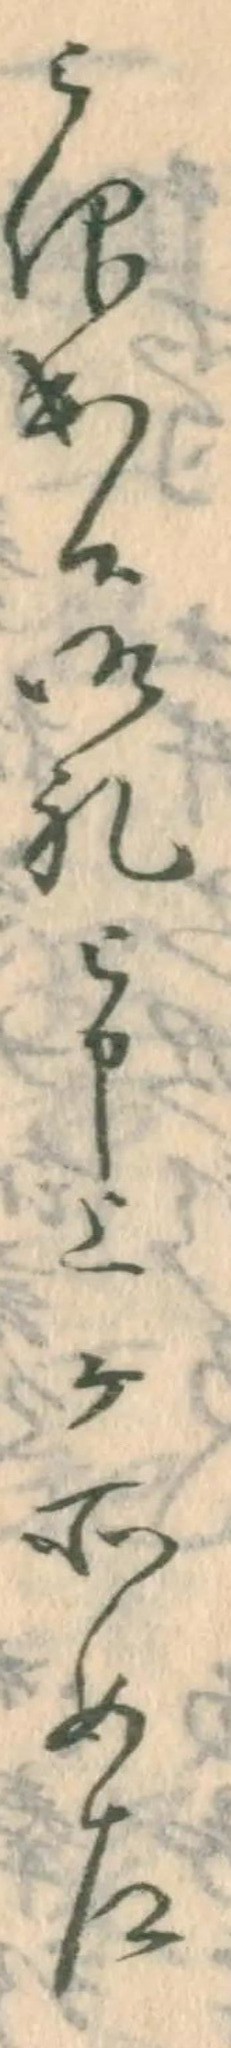被仰出候御礼被申上ケ所如左
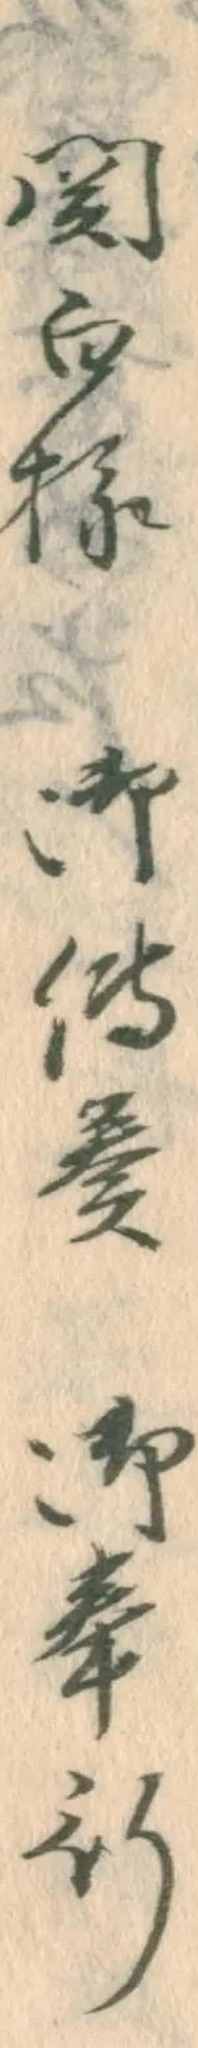関白様御伝奏御奉行
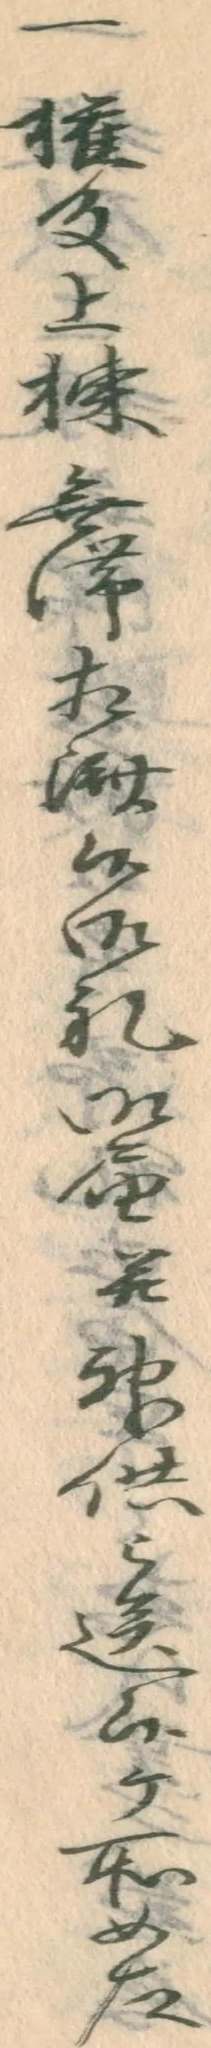一権殿上棟無滞相済候御礼御届并神供被送候ケ所如左
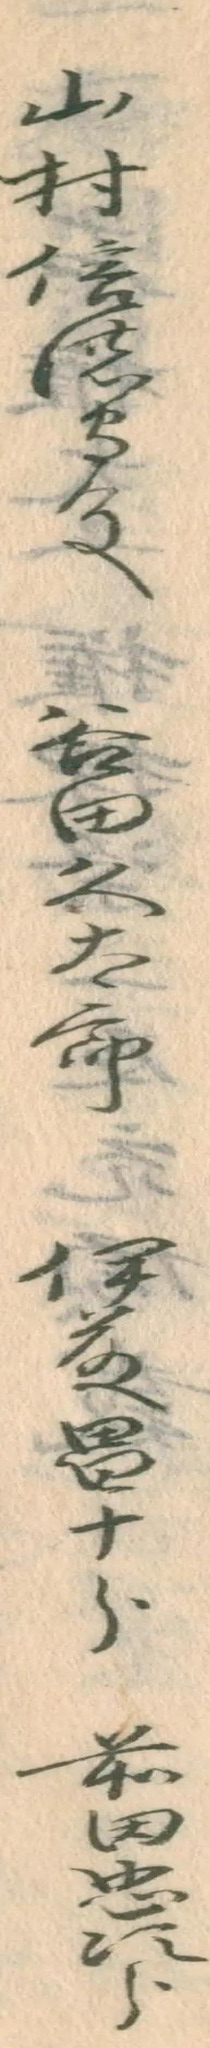山村信濃守殿谷田久太郎伊藤昌十郎前田忠次郎
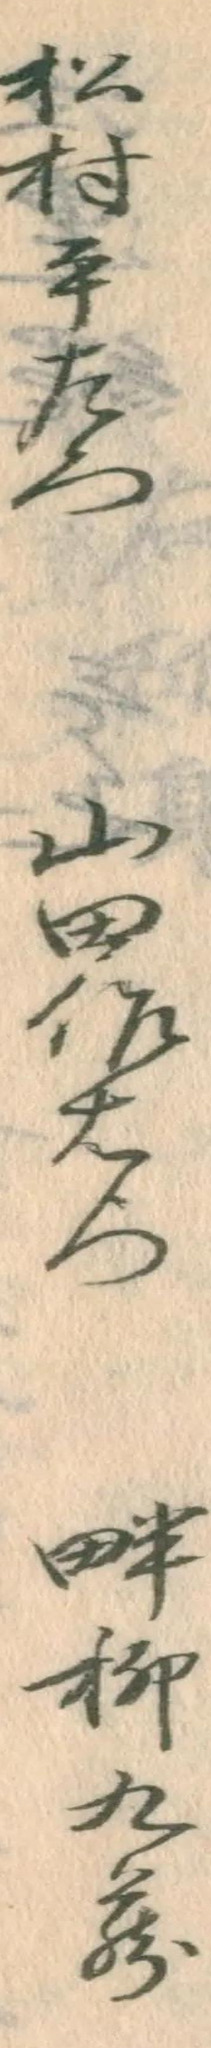松村平左衛門山田作右衛門畔柳九蔵
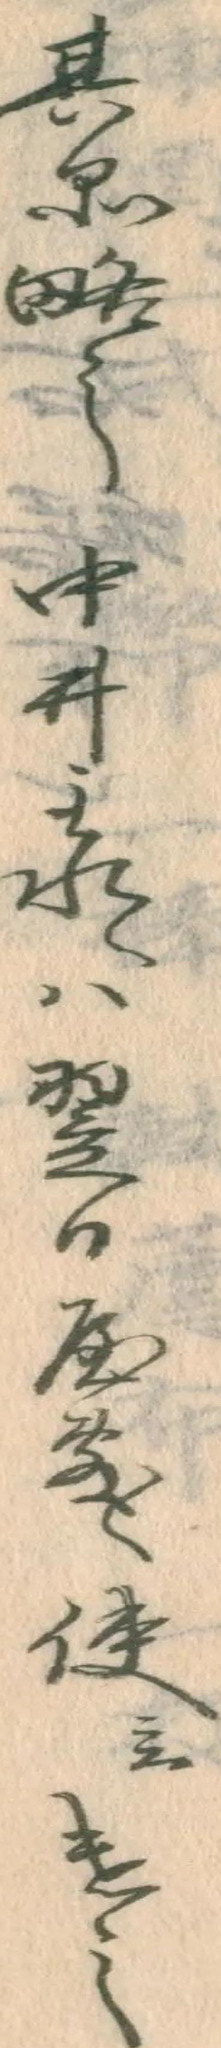其品略之中井主水へハ翌日屋敷へ使ニ而遣之
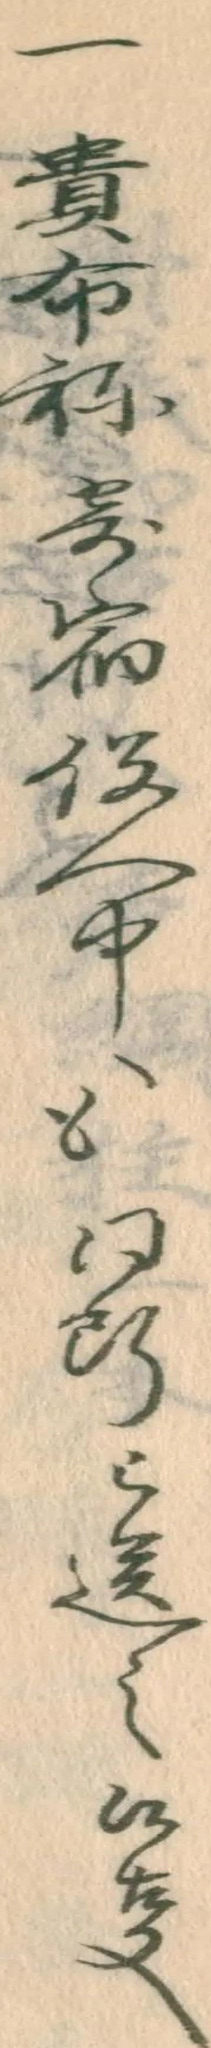一貴布祢寄宿役人中へも同断被送之候事
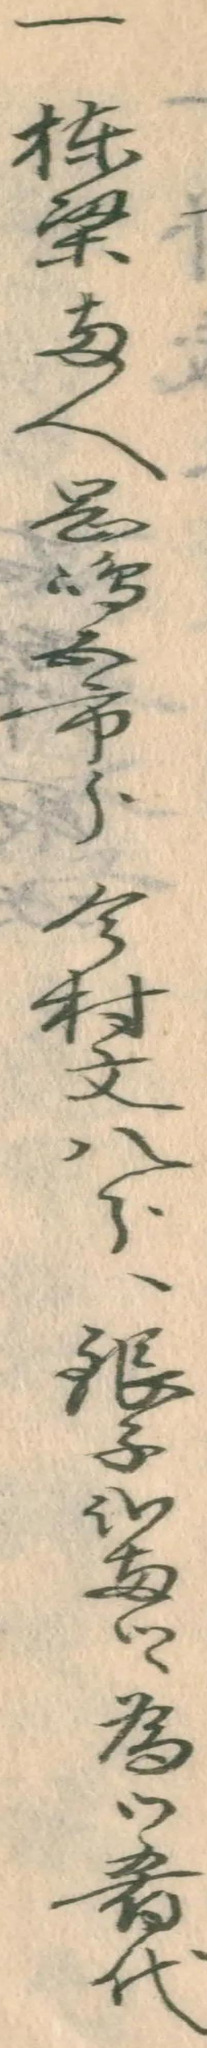一棟梁両人岡嶋五市郎今村文八郎へ銀子弐両ツヽ為御肴代
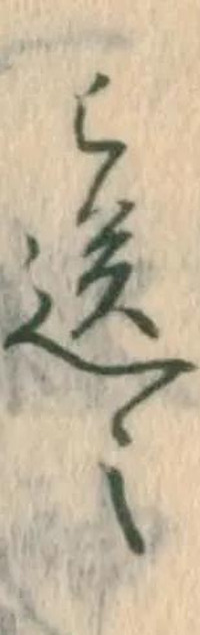被送之
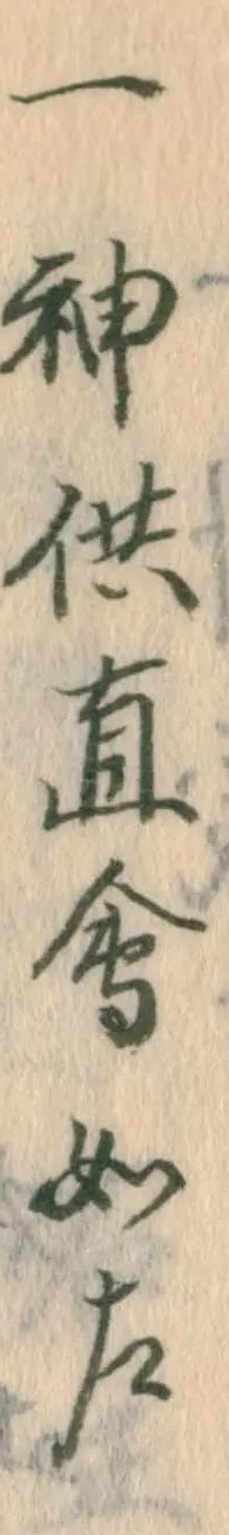一神供直会如左
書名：賀茂社記録. 第17冊
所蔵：国立国会図書館 National Diet Library, JAPAN
